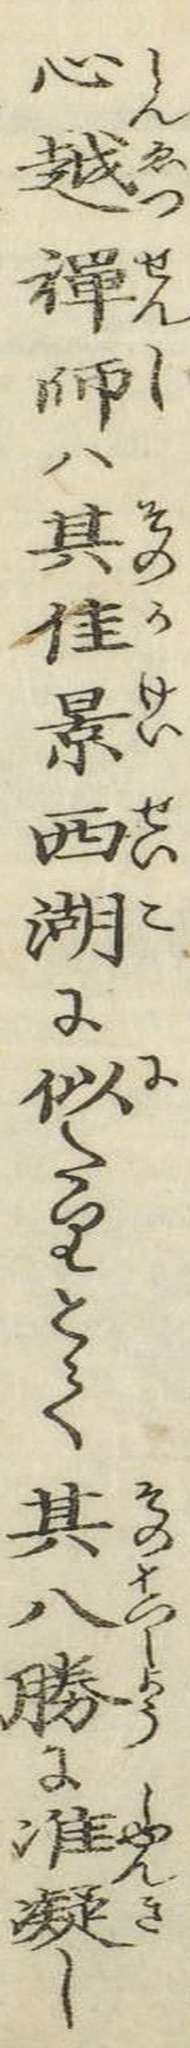心越禪師は其佳景西湖に似たりとて其八勝に准凝し
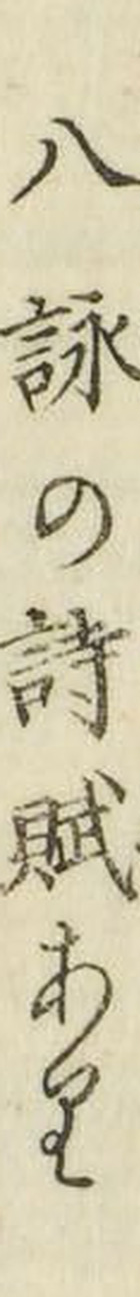八詠の詩賦あり
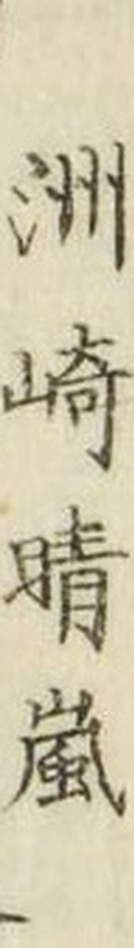洲崎晴嵐
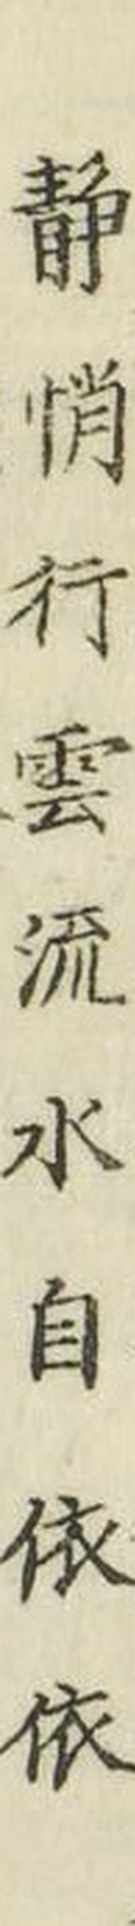静悄行雲流水自依依
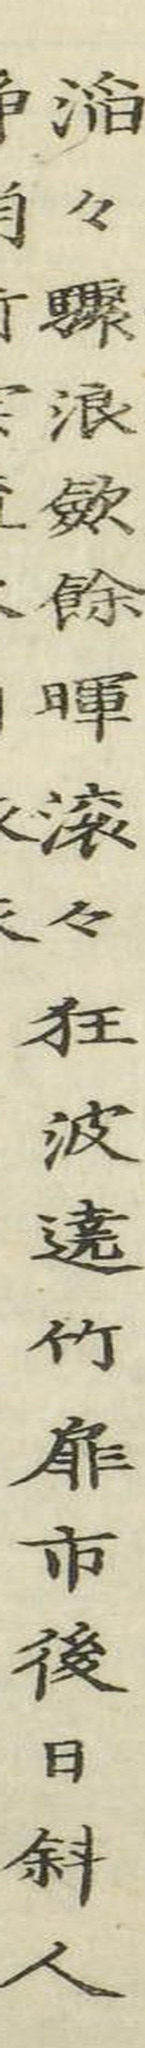㴞々驟浪歛餘暉滾々狂波遶竹扉市後日斜人
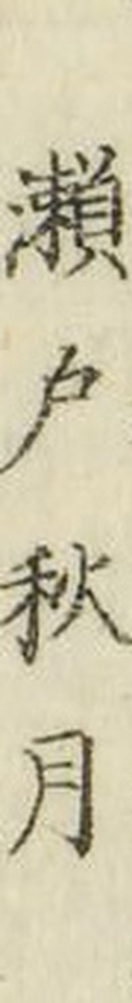瀬戸秋月
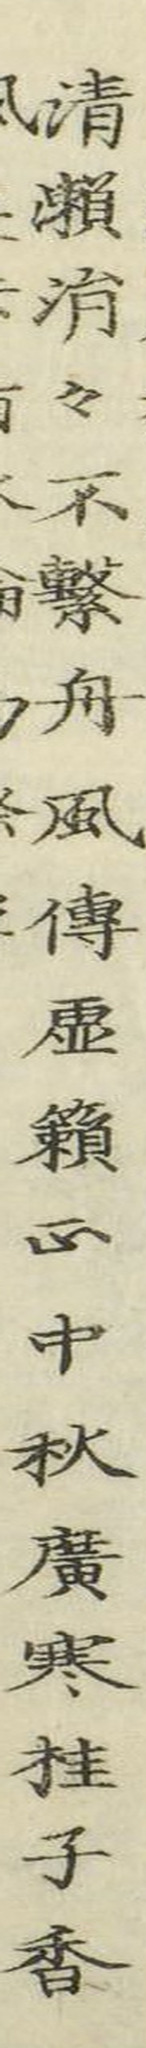清瀬㳙々不繋舟風傳虚籟正中秋廣寒桂子香
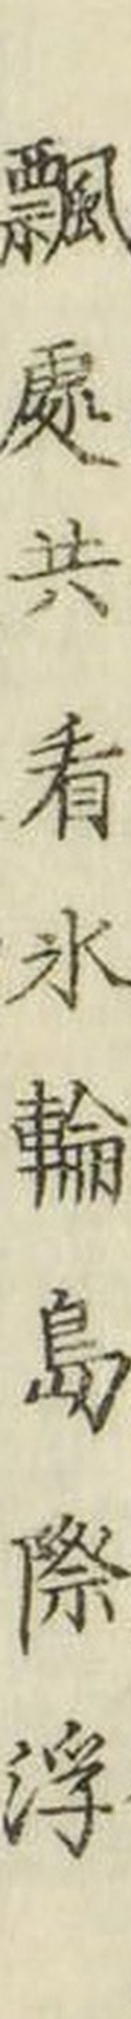飄處共看氷輪島際浮
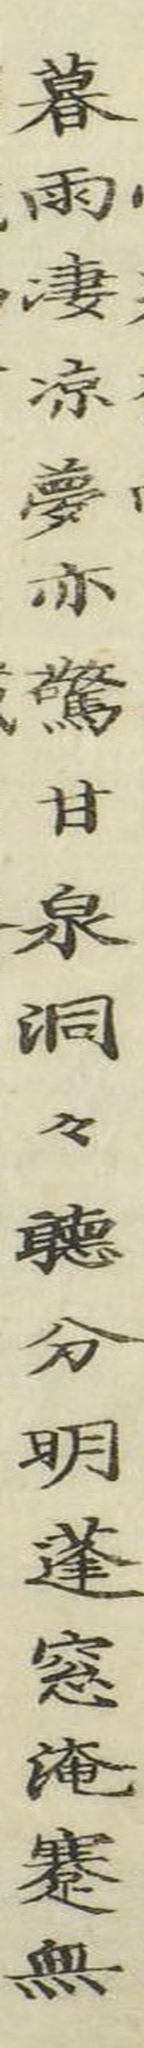暮雨凄凉夢亦驚甘泉洞々聽分明蓬窓淹蹇無
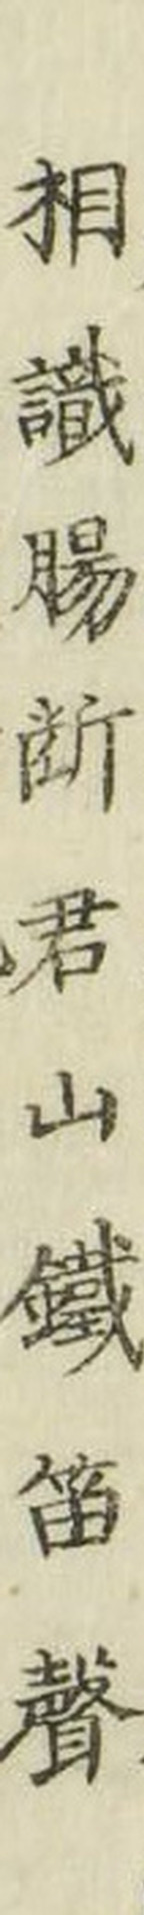相識腸断君山鐡笛聲
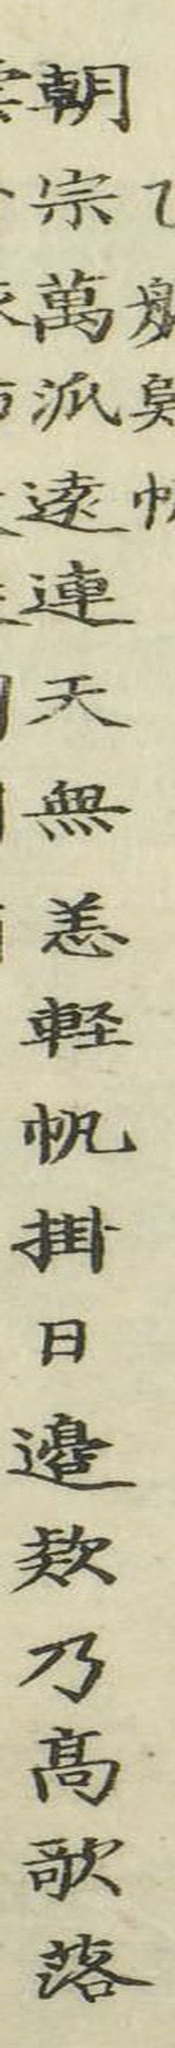朝宗萬派遠連天無恙軽帆掛日邉欤乃髙歌落
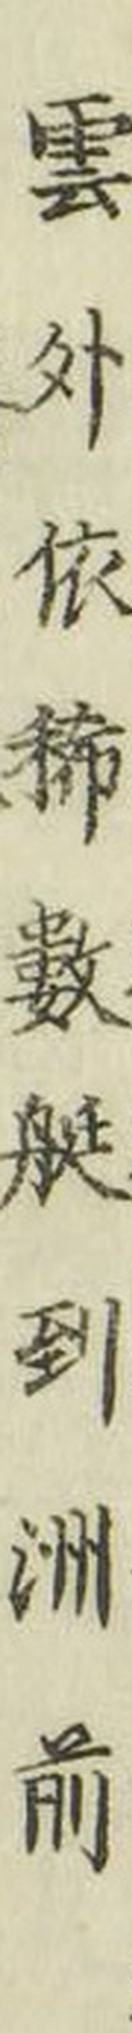雲外依稀數艇到洲前
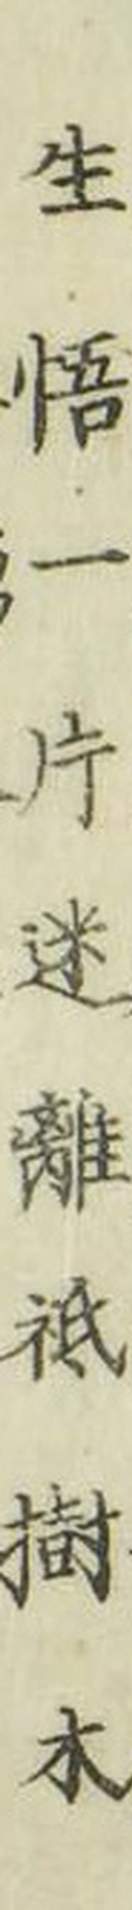生悟一片迷離祗樹木
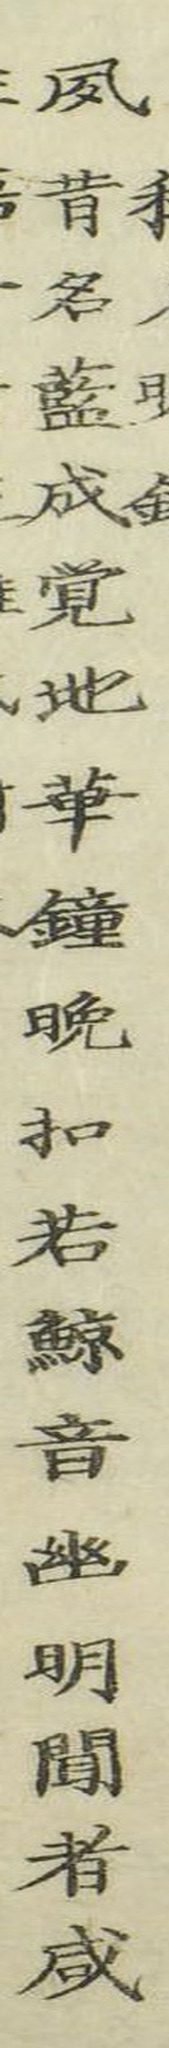夙昔名藍成覚地華鐘晩扣若鯨音幽明聞者咸
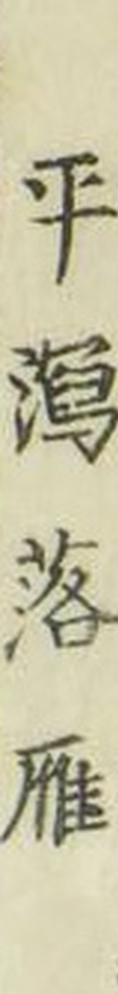平㵼落雁

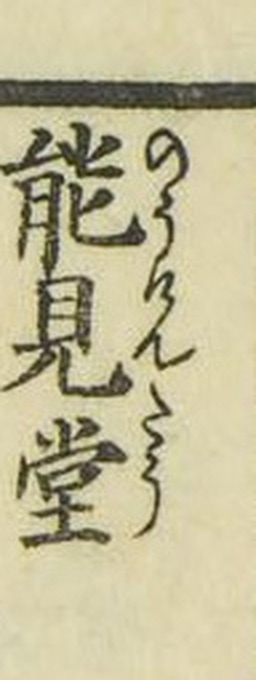能見堂
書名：江戸名所図会 20巻 巻之6
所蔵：東京学芸大学教育コンテンツアーカイブ
